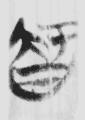智
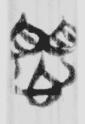{䀠心}
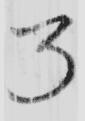乃
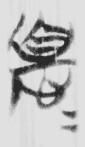𢝊=
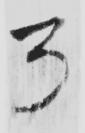乃
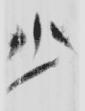少
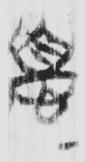𢝊
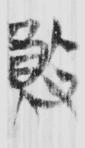{員攴}
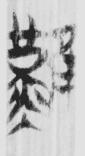難
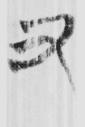又
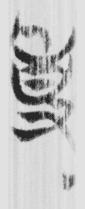事
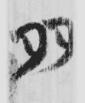多
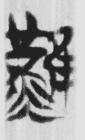難
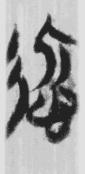{彳斤心}
